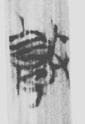{㱿子}
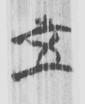五
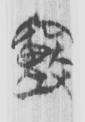{穴甶壬攴}
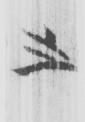之
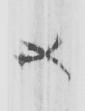又
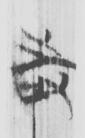𠱾
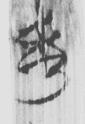秀
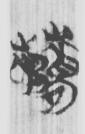{艸矛夢}
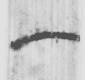一
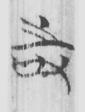𠱾
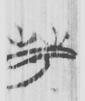芋
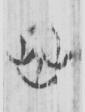卉
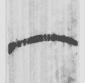一
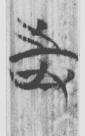𠱾
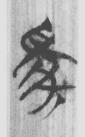{爪家}
